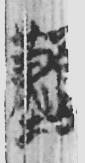戁（難）
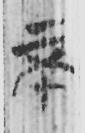不
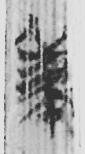秉
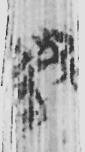純
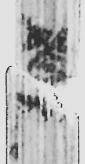惪
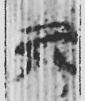亓
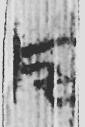厇
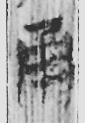甬
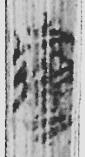{辶止㚔}（失）
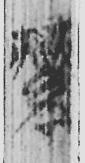縈
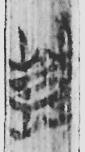莫
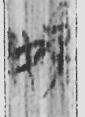好
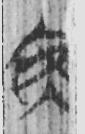安
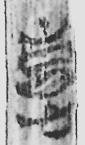情
